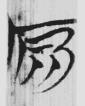原
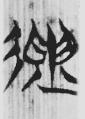{彳𦥔少}
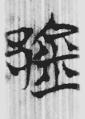{金阝}
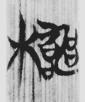櫮
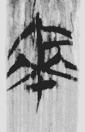{宀𠂔}
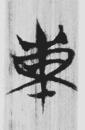東
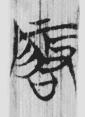啟
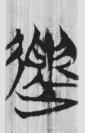遺
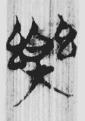樂
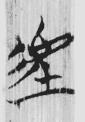𫊟
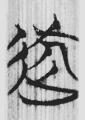迖
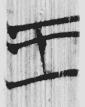王
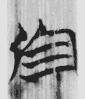於
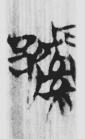{葛阝}
